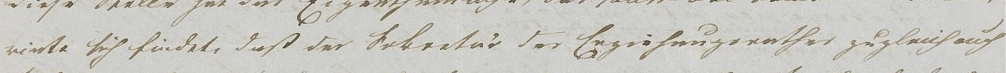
riate sich findet, daß der Sekretär des Erziehungsrathes zugleich auch
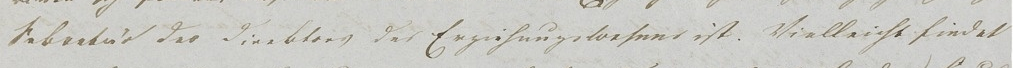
Sekretär des Direktors des Erziehungswesens ist. Vielleicht findet
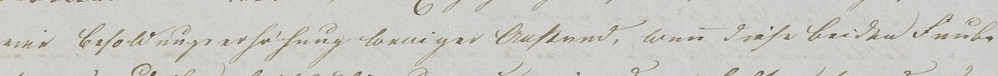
eine Besoldungserhöhung weniger Anstand, wenn diese beiden Funk-
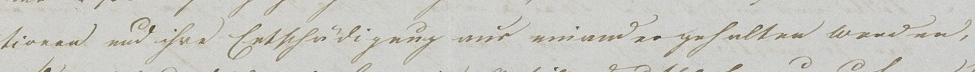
tionen und ihre Entschädigung aus einander gehalten werden,
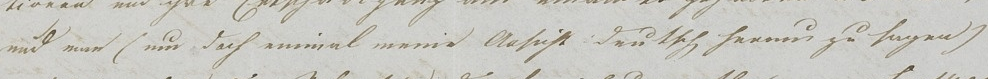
und man (um doch einmal meine Ansicht deutsch heraus zu sagen)
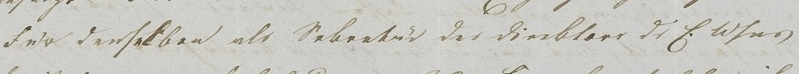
Für denselben als Sekretär des Direktors dsE.Wsns "
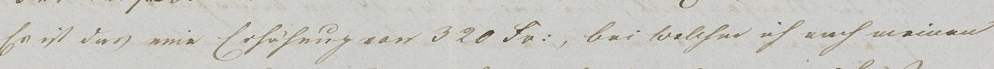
Es ist das eine Erhöhung von 320 Fr:, bei welcher ich nach meinen
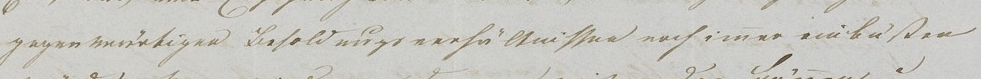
gegenwärtigen Besoldungsverhältnissen noch immer einbüßen
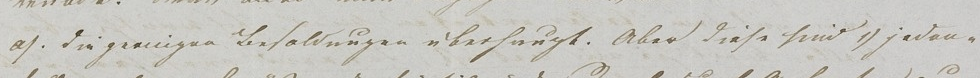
a). die geringen Besoldungen überhaupt. Aber diese sind 1) jeden-
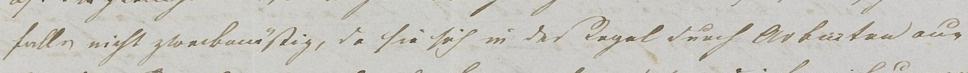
falls nicht zweckmäßig, da sie sich in der Regel durch Arbeiten au-
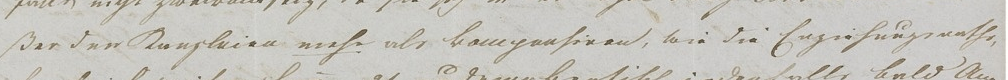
ßer den Kanzleien mehr als kompensiren, wie die Erziehungsraths-
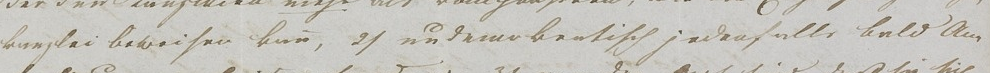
kanzlei beweisen kann, 2) undemokratisch jedenfalls bald An-
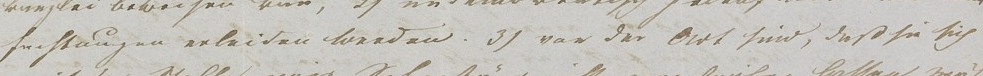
fechtungen erleiden werden. 3) von der Art sind, daß sie sich
